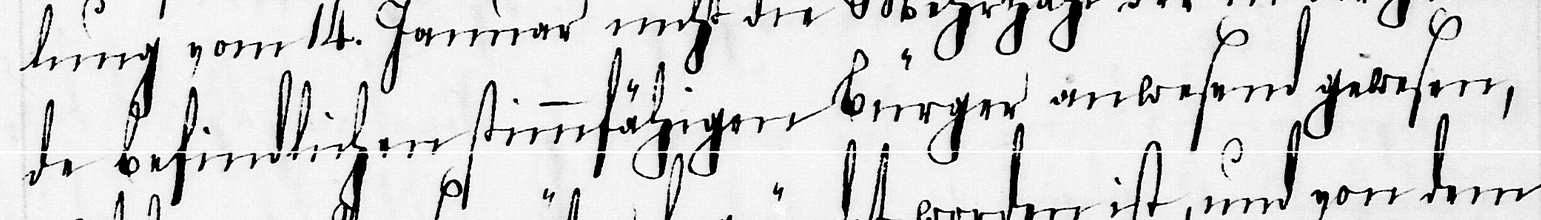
de befindlichen stimmfähigen Bürger anwesend gewesen,
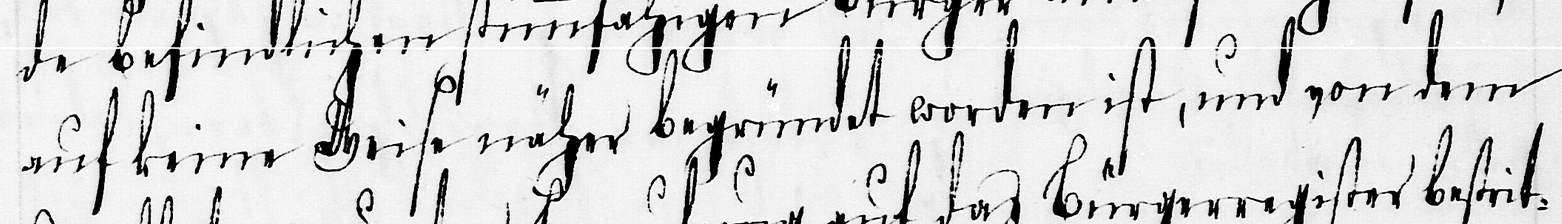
auf keine Weise näher begründet worden ist, und von dem
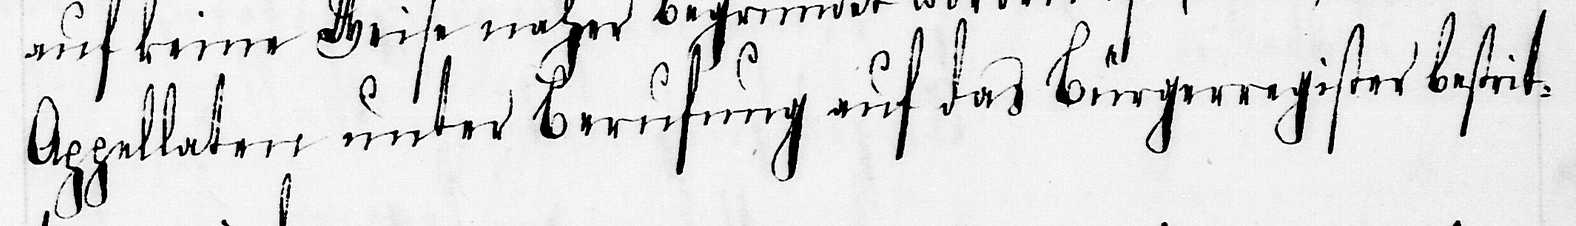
Appellaten unter Berufung auf das Bürgerregister bestri¬
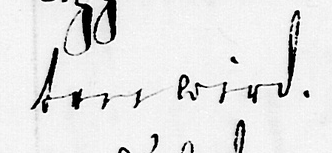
tten wird.
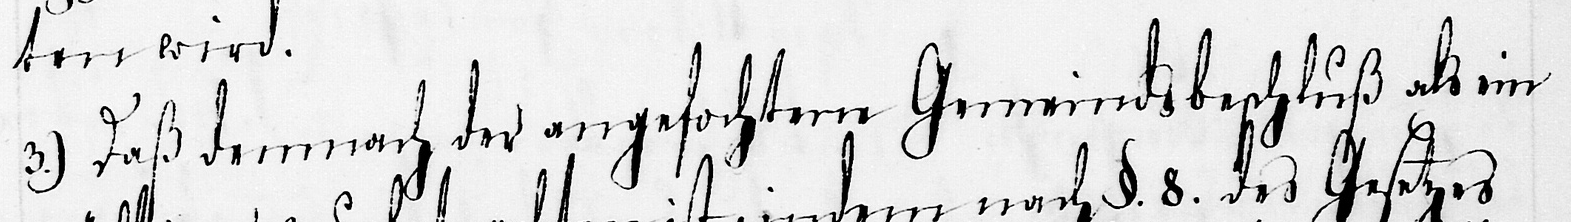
3.) Daß demnach der angefochtene Gemeindsbeschluß als ein
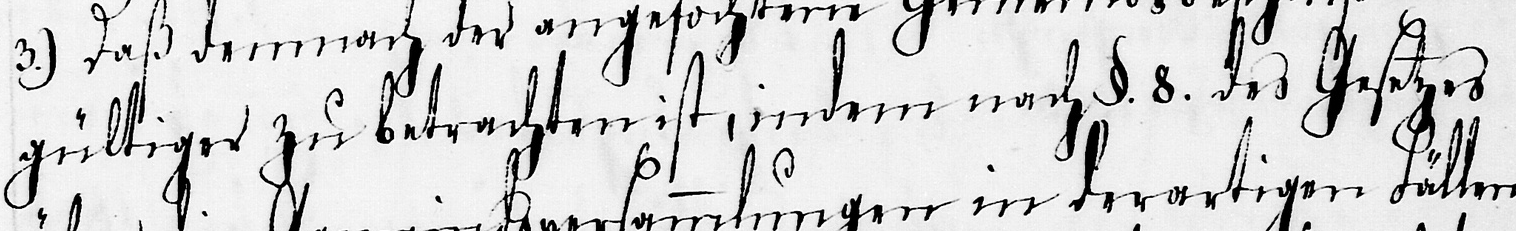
gültiger zu betrachten ist, indem nach §. 8. des Gesetzes
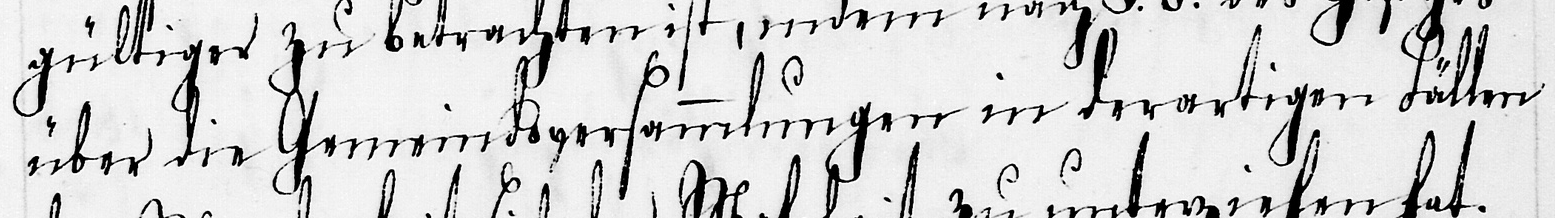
über die Gemeindsversammlungen in derartigen Fällen
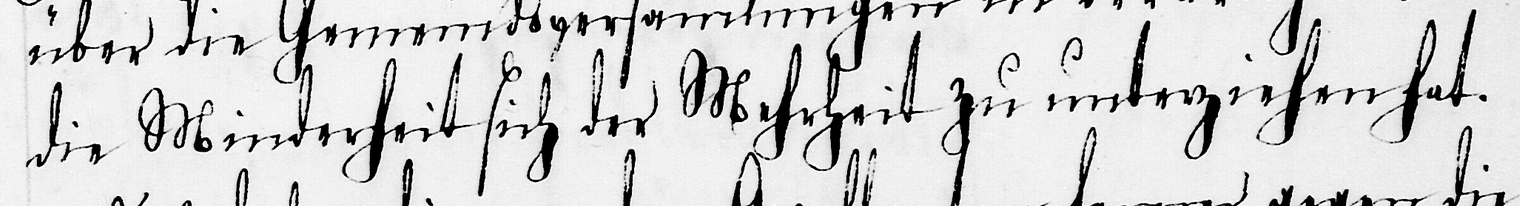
die Minderheit sich der Mehrheit zu unterziehen hat.
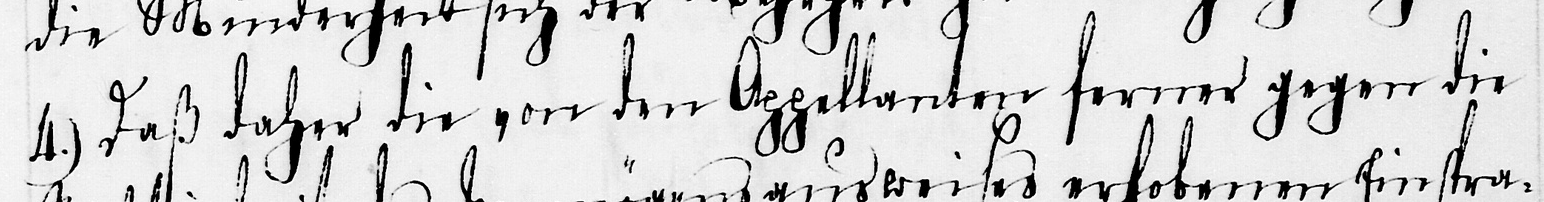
4.) Daß daher die von den Appellanten ferner gegen die
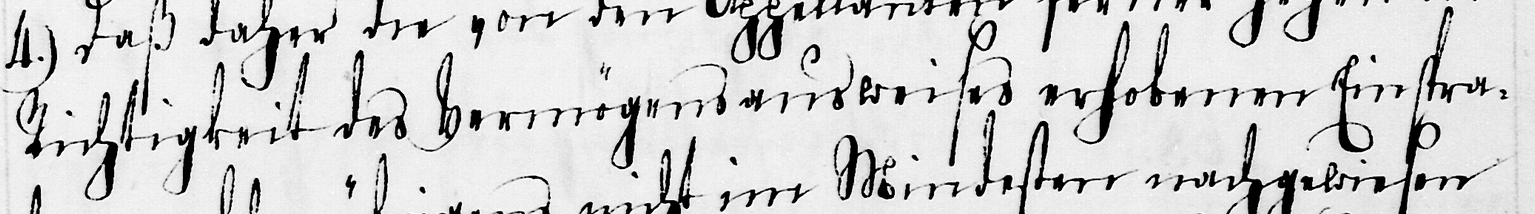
Richtigkeit des Vermögensausweises erhobenen Einspra¬
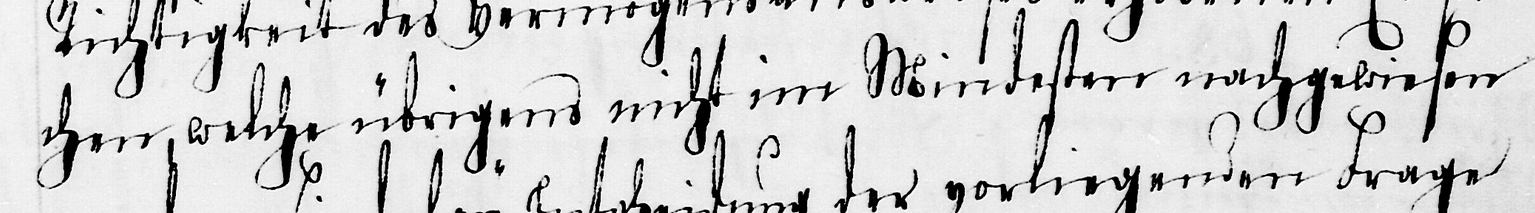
chen, welche übrigens nicht im Mindesten nachgewiesen
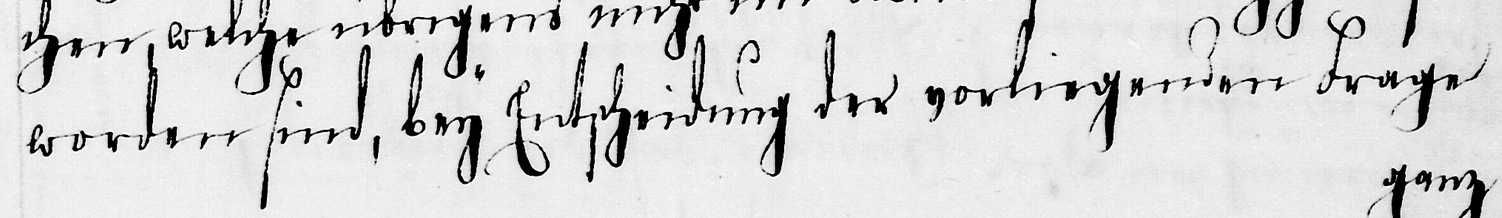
worden sind, bey Entscheidung der vorliegenden Frage
